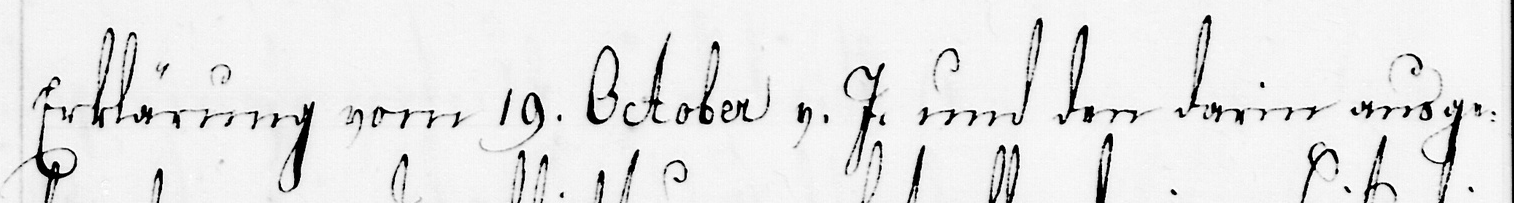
Erklärung vom 19. October v. J. und den darin ausge¬
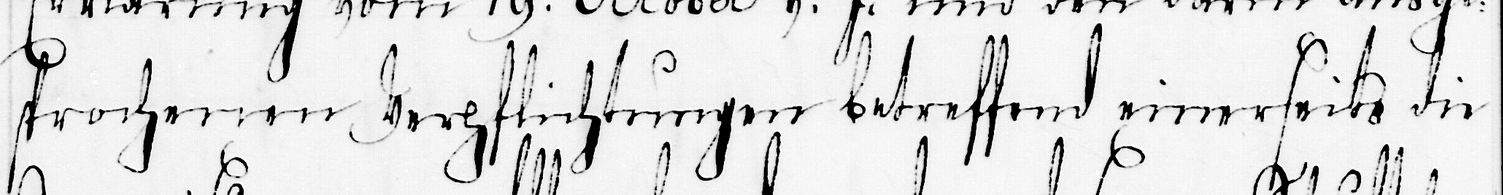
sprochenen Verpflichtungen betreffend einerseits in
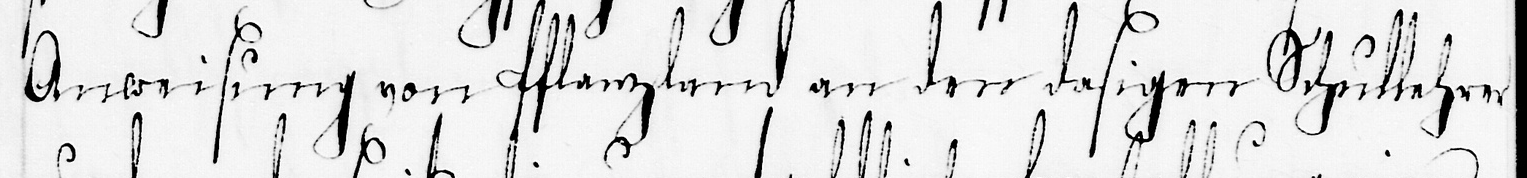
Anweisung von Pflanzland an den dasigen Schullehrer
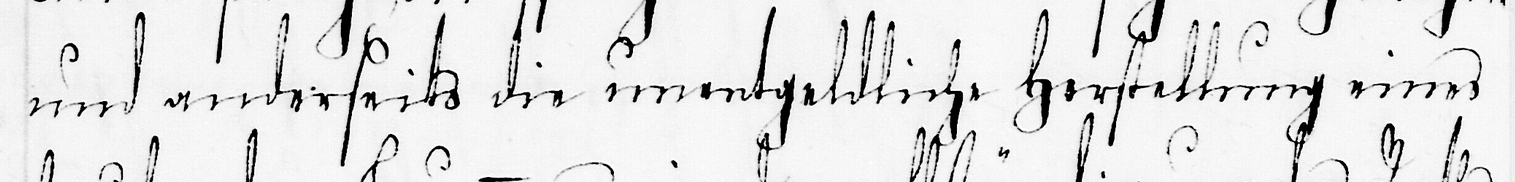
und anderseits die unentgeldliche Herstellung eines
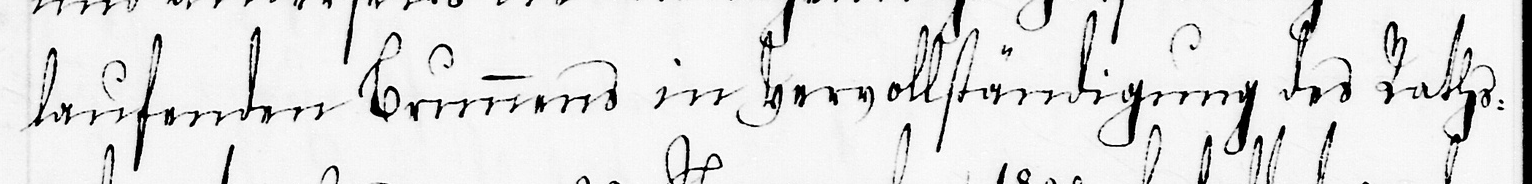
laufenden Brunnens in Vervollständigung des Raths¬
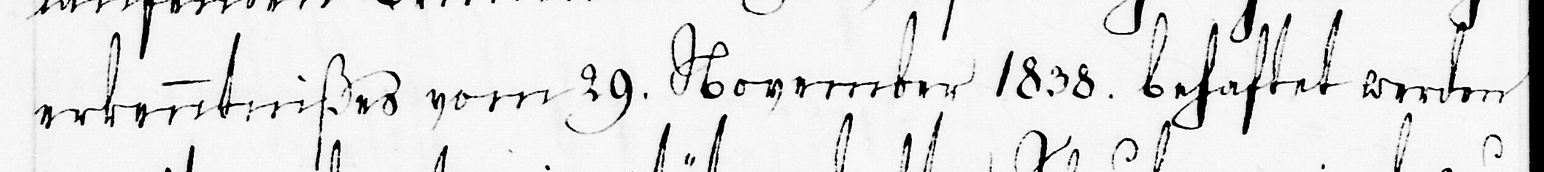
erkenntnißes vom 29. November 1838. behaftet werden
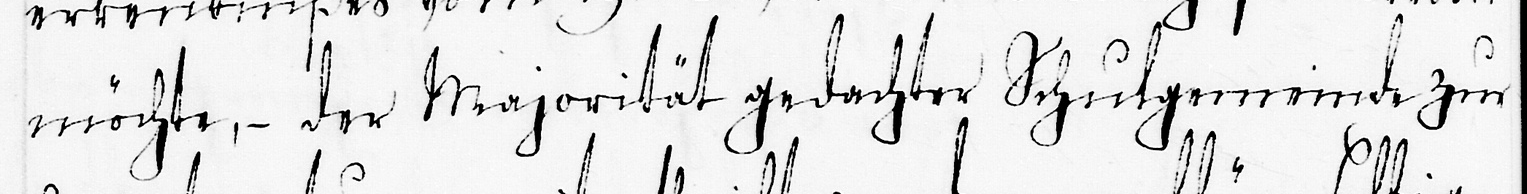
möchte, – der Majorität gedachter Schulgemeinde zur
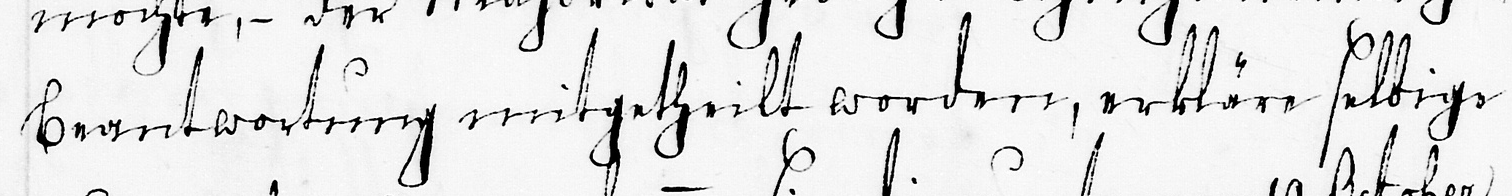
Beantwortung mitgetheilt worden, erkläre selbige
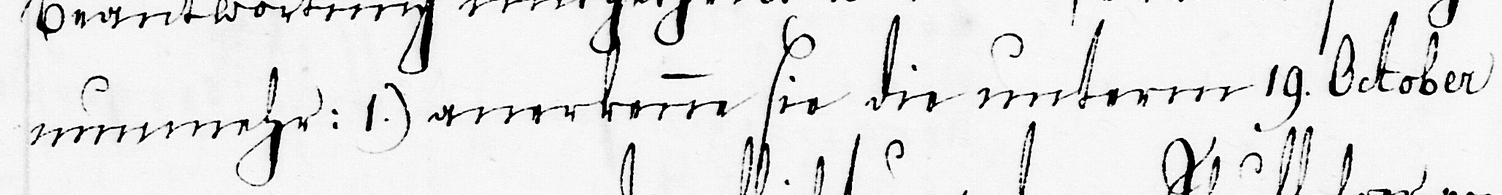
nunmehr: 1.) anerkenne sie die unterm 19. October
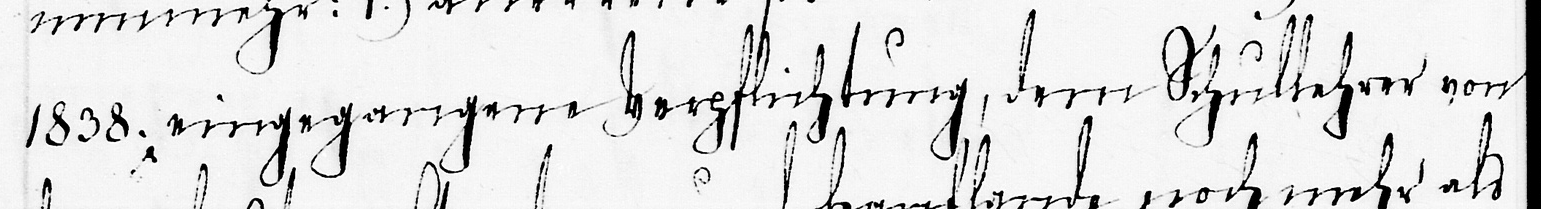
1838. eingegangene Verpflichtung, dem Schullehrer von
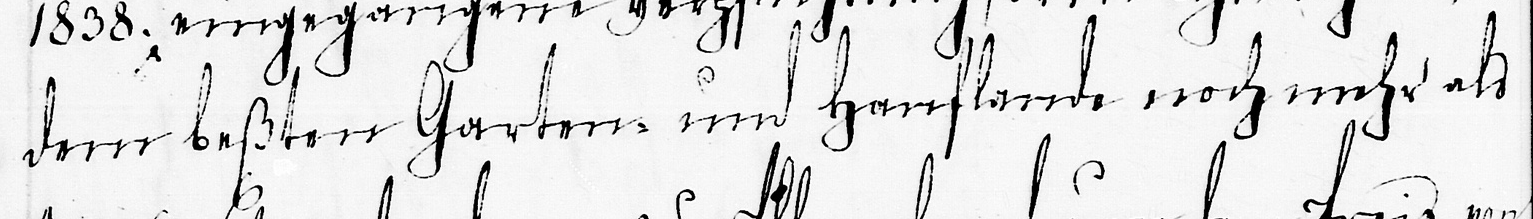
dem beßten Garten- und Hanflande noch mehr als
